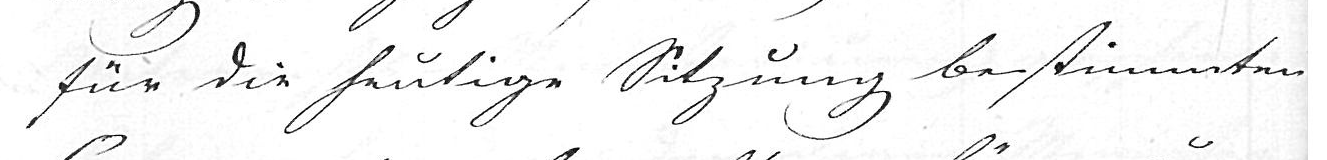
für die heutige Sitzung bestimmten
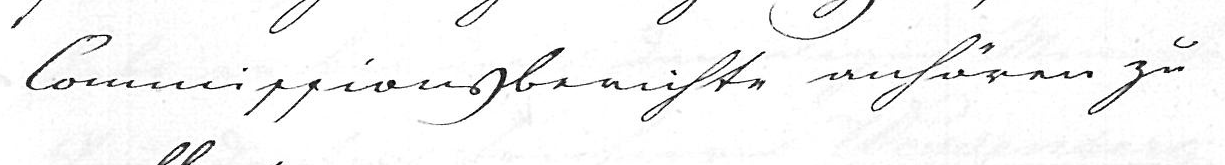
Commissionsberichte anhören zu
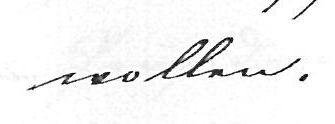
wollen.
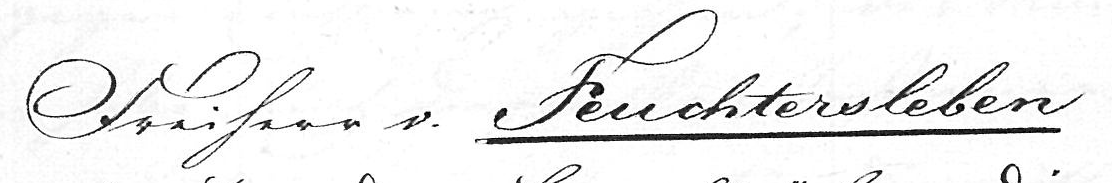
Freiherr v. Feuchtersleben
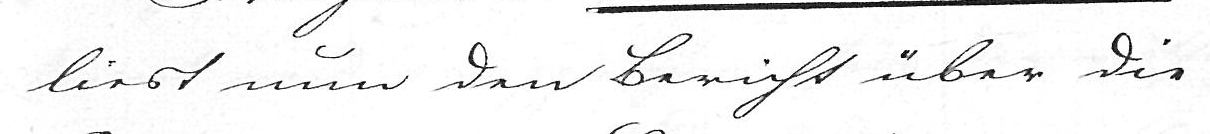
liest nun den Bericht über die
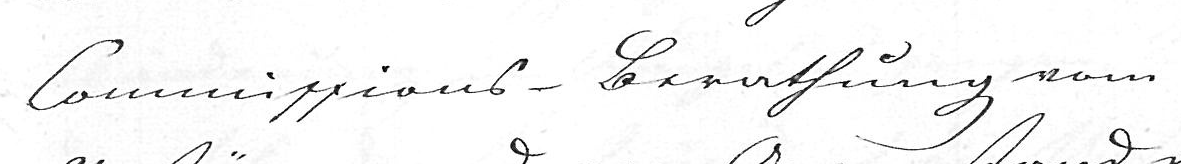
Commissions-Berathung vom
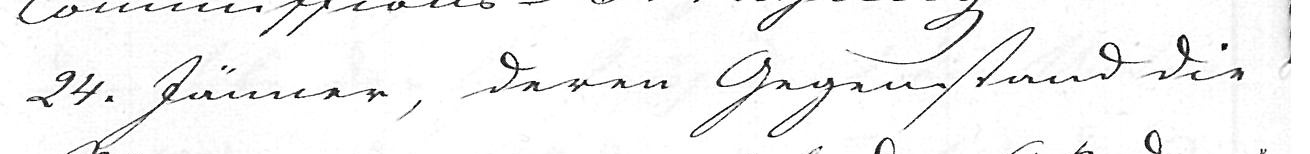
24. Jänner, deren Gegenstand die
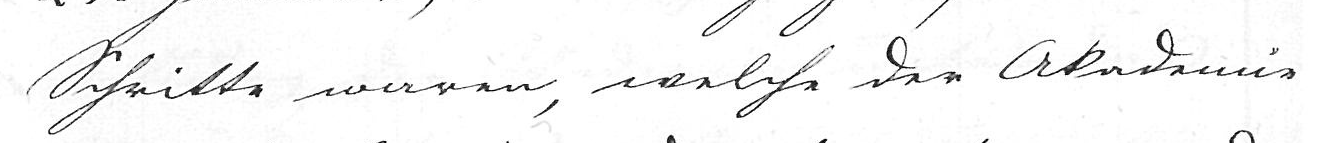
Schritte waren, welche der Akademie
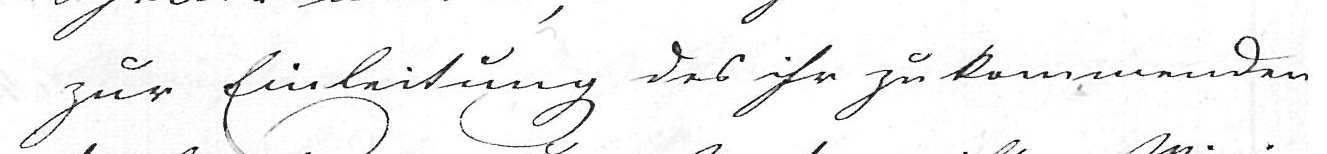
zur Einleitung des ihr zukommenden
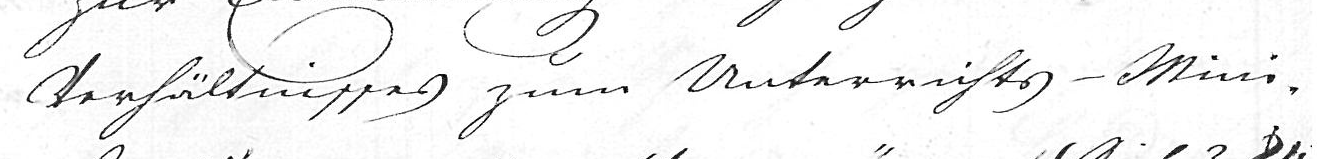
Verhältnisses zum Unterrichts-Mini-
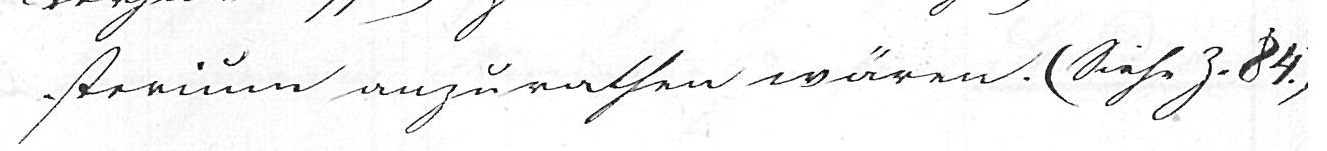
sterium anzurathen wären. (Siehe Z. 84,
